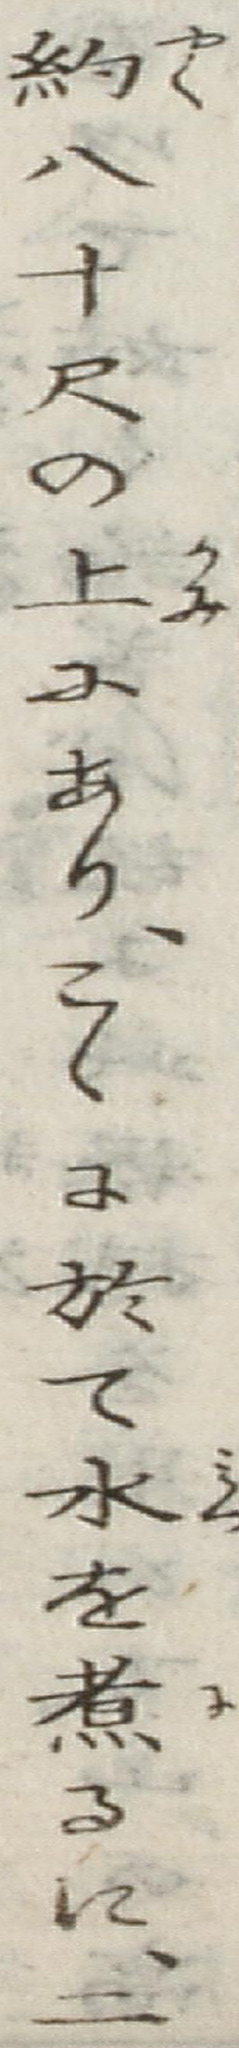約八十尺の上にあり、こゝに於て水を煮るに、二
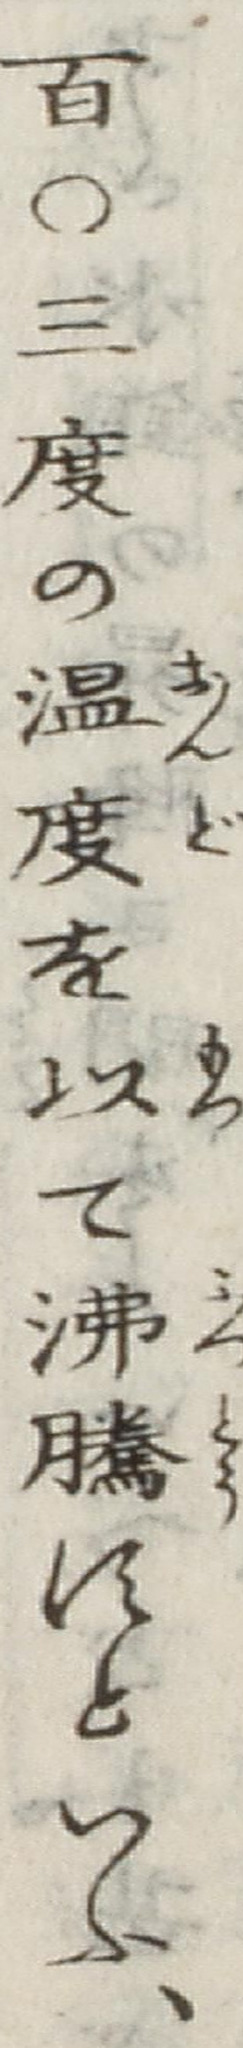百〇三度の温度を以て沸騰すといふ、
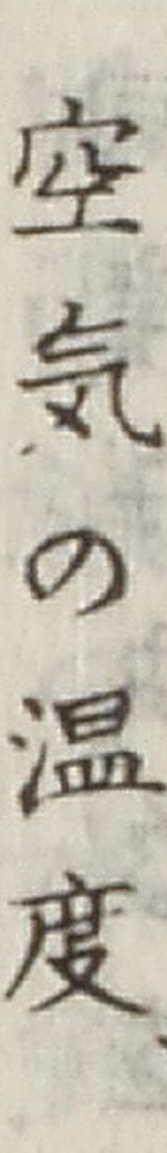空気の温度、
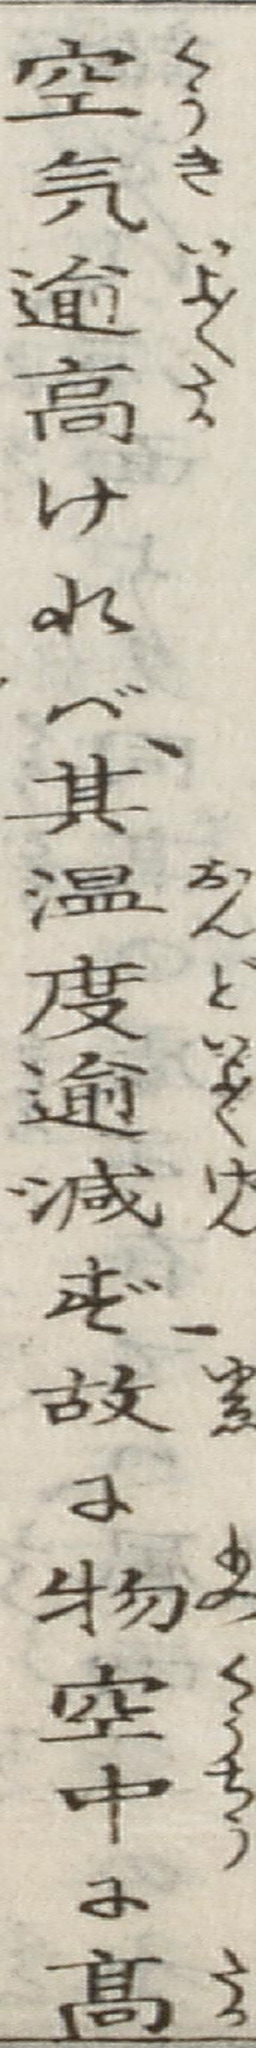空気愈高ければ、其温度愈減ず、故に物空中に高
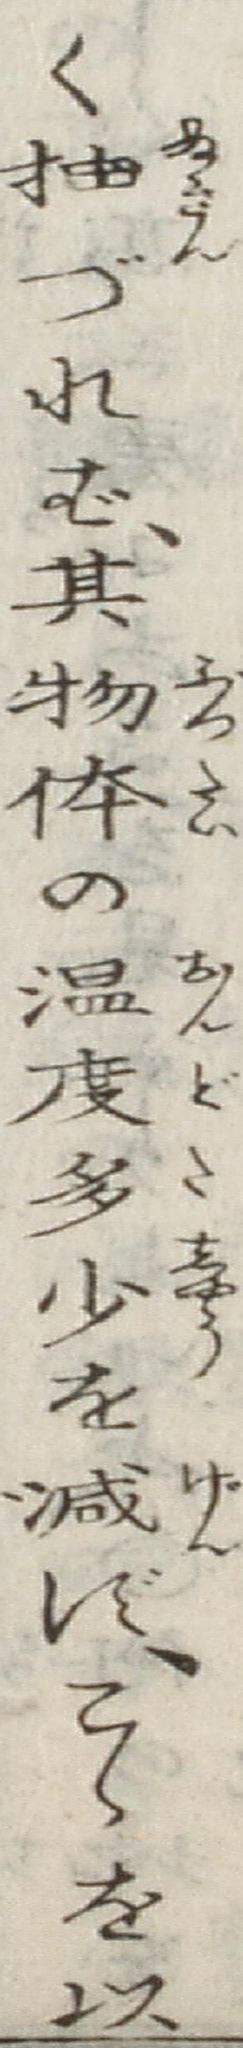く抽づれば、其物体の温度多少を減ず、こゝを以
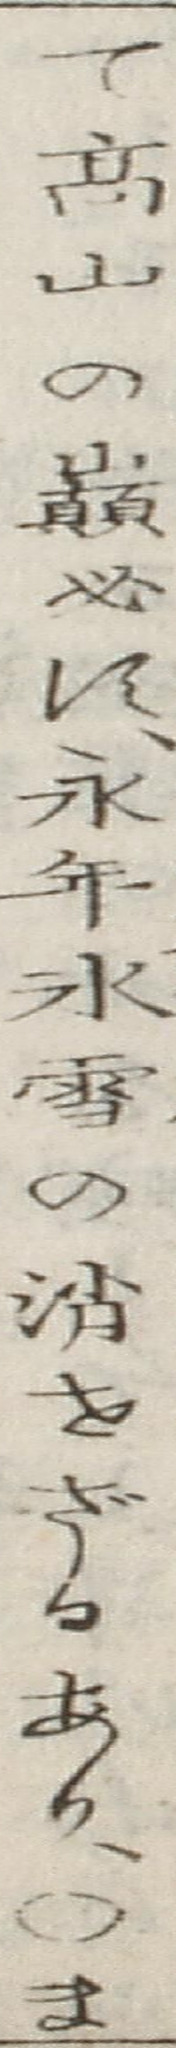て高山の頂必す、永年氷雪の消せざるあり、○ま
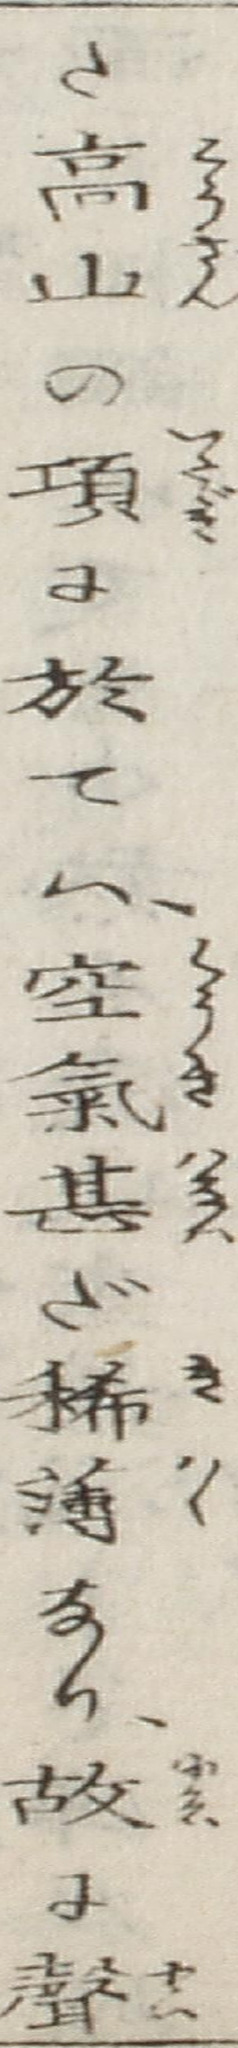た高山の頂に於ては、空気甚だ希薄なり、故に声
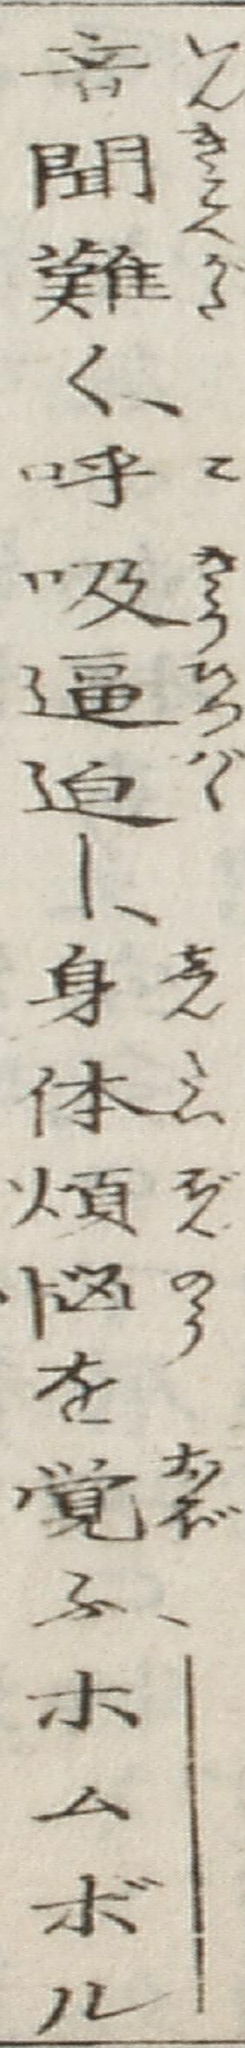音聞難く、呼吸逼迫し、身体煩悩を覚ふ、ホムボル
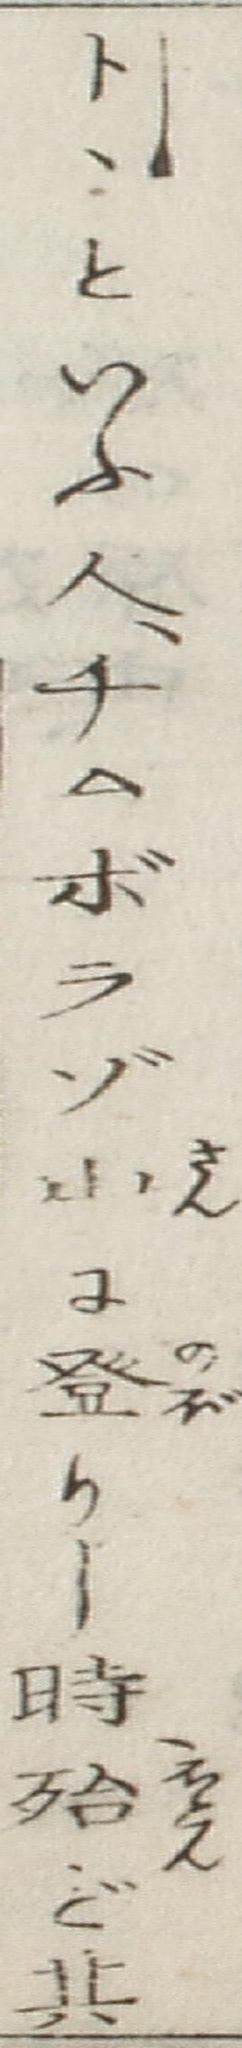トヽといふ人、チムボラゾ山に登りし時、殆ど其
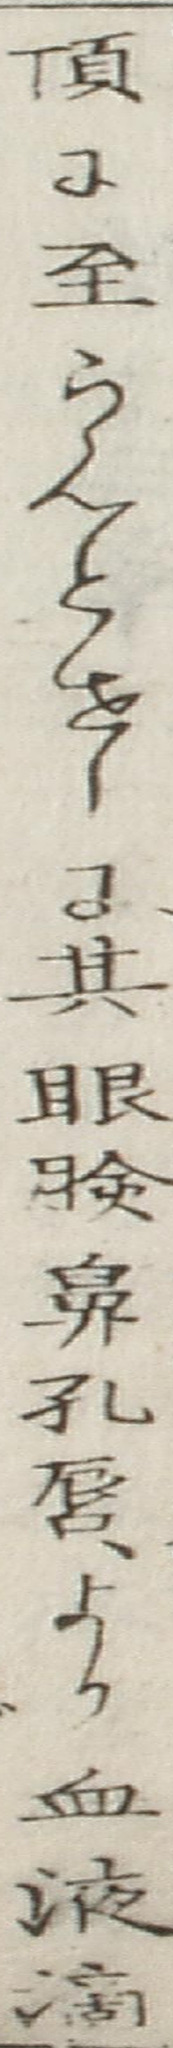頂に至らんとせしに、其眼瞼鼻孔唇より血液滴
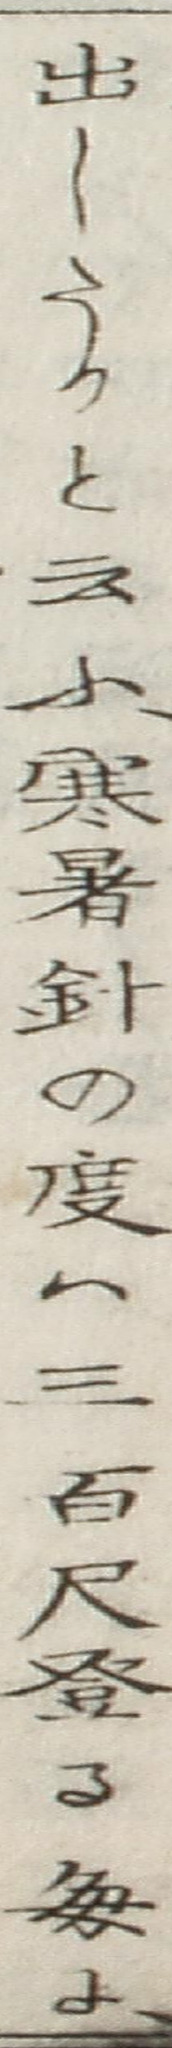出したりと云ふ、寒暑針の度は三百尺登る毎に、
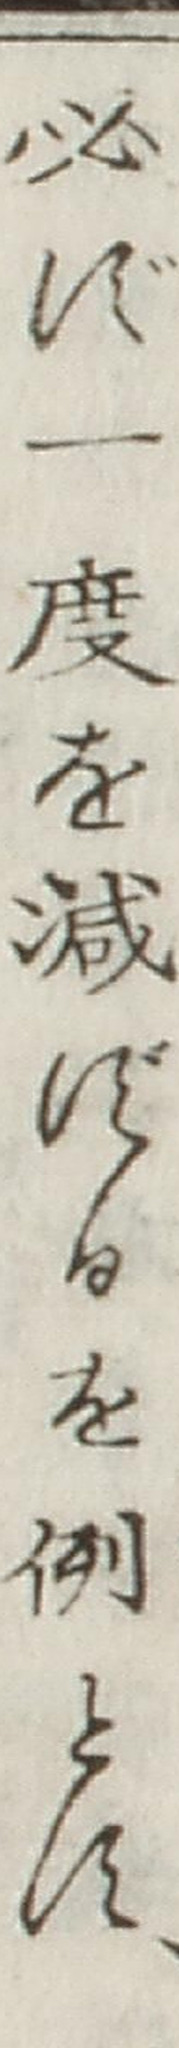必ず一度を減ずるを例とす、
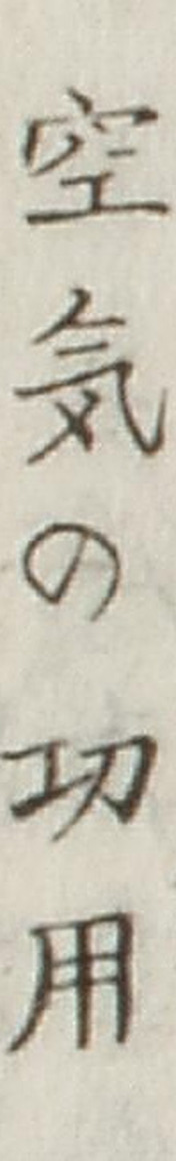空気の功用
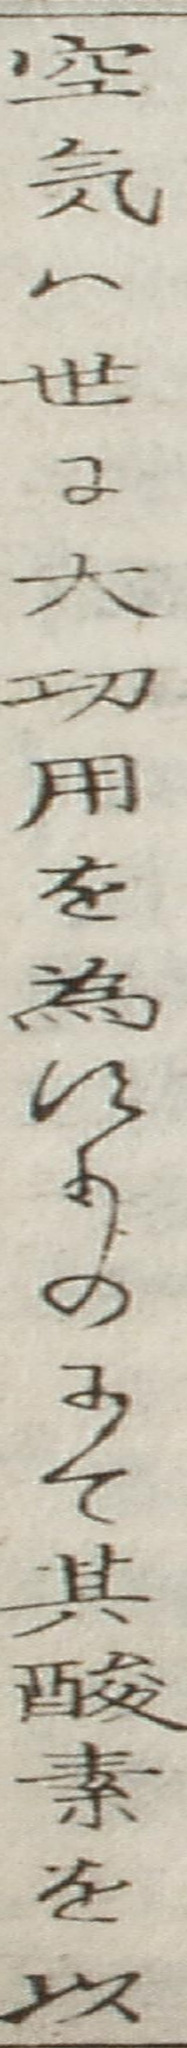空気は世に大功用を為すものにて其酸素を以

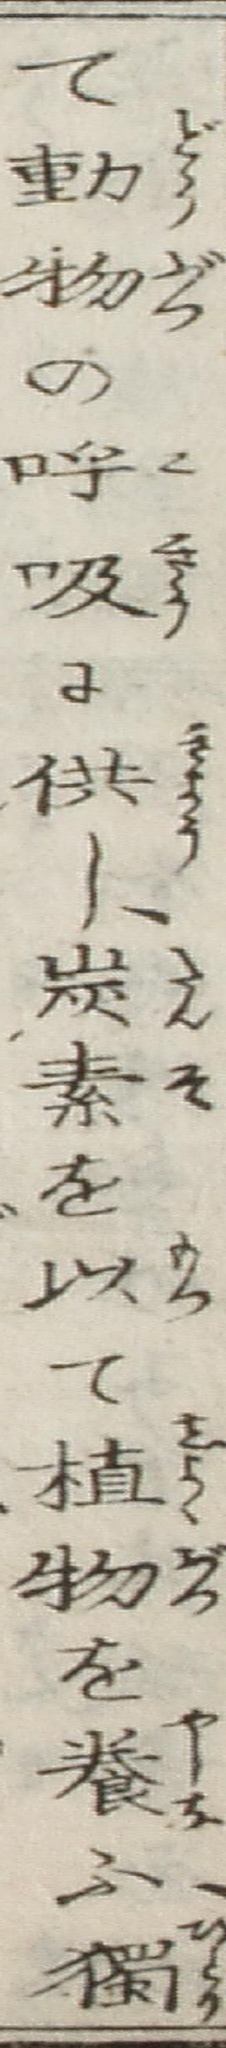て動物の呼吸に供し、炭素を以て植物を養ふ、独
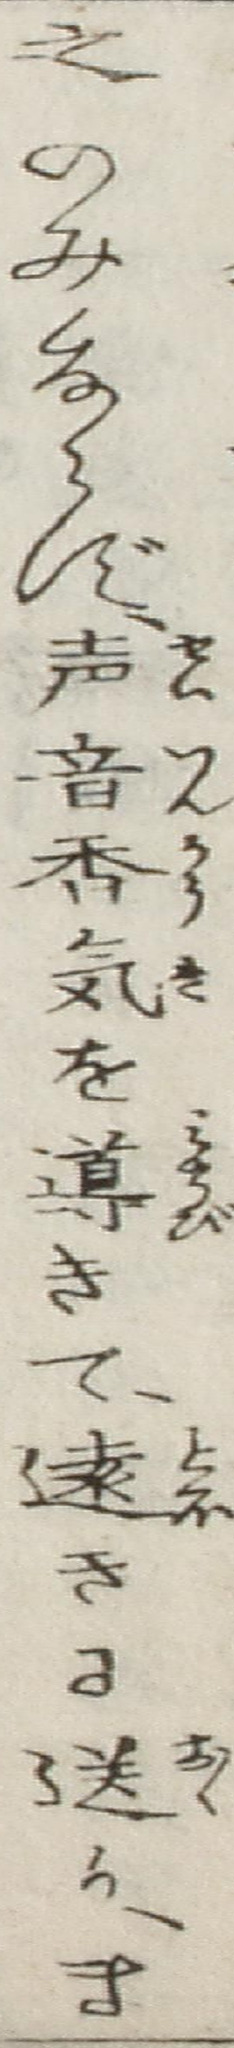之のみならず、声音香気を導きて、遠きに送り、ま
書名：訓蒙　天然地理學　中
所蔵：東京大学地震研究所図書室 Earthquake Research Institute Library, The University of Tokyo, JAPAN
